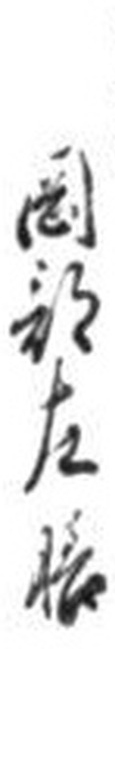岡部左膳
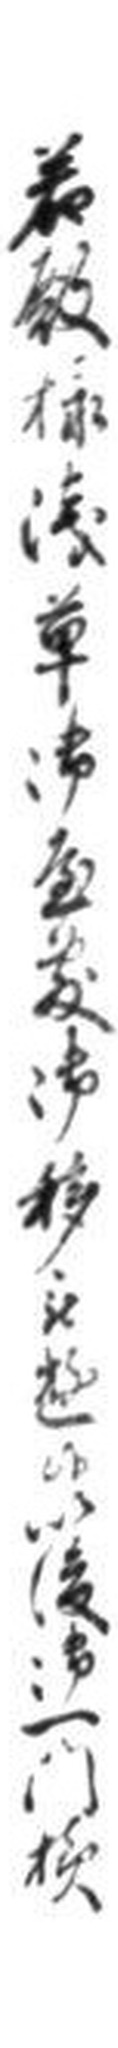若殿様浅草御屋敷御移被遊候以後御一門様
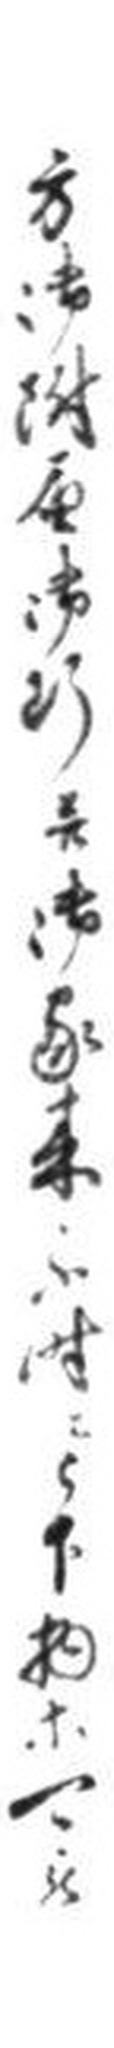方御付届御断并御家来不時ニ被下物等可被
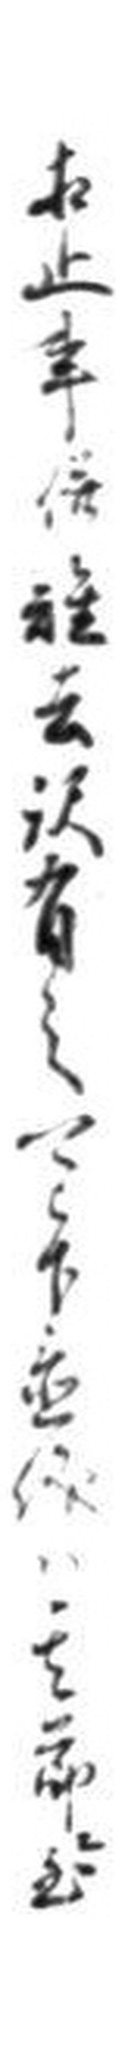相止事併難去訳有之可被下置儀ハ其節ニ至
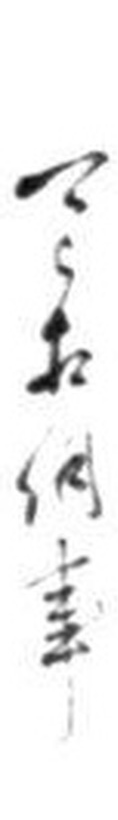可被相伺事
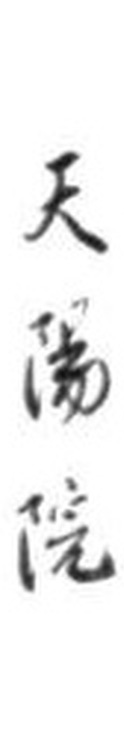天陽院
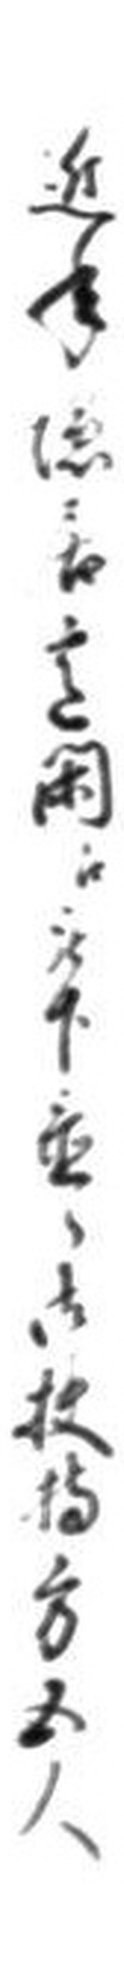近年隠居意閑江被下置候御扶持方五人
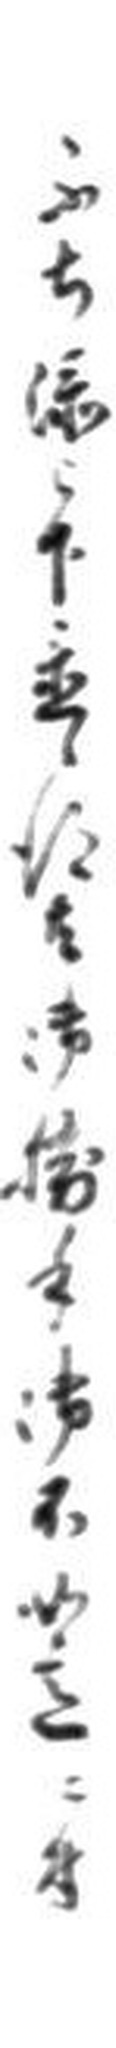ふち添被下置候得共御勝手御不如意ニ付
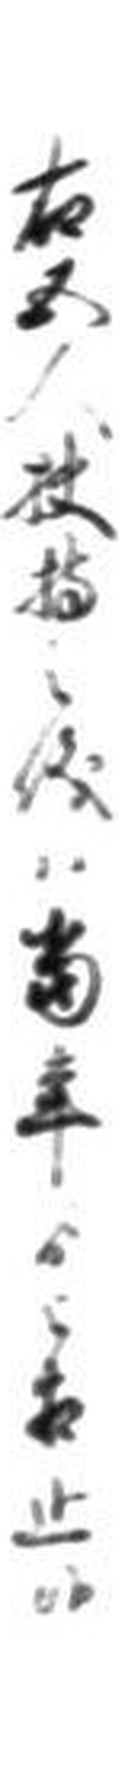右五人扶持之儀ハ当年ゟ被相止候
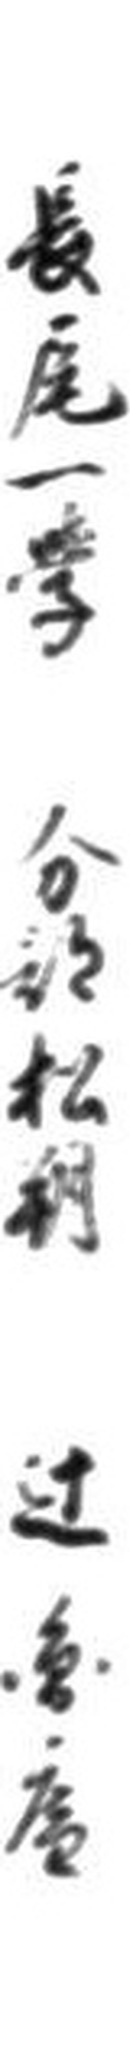長尾一学分部松朔辻円庵
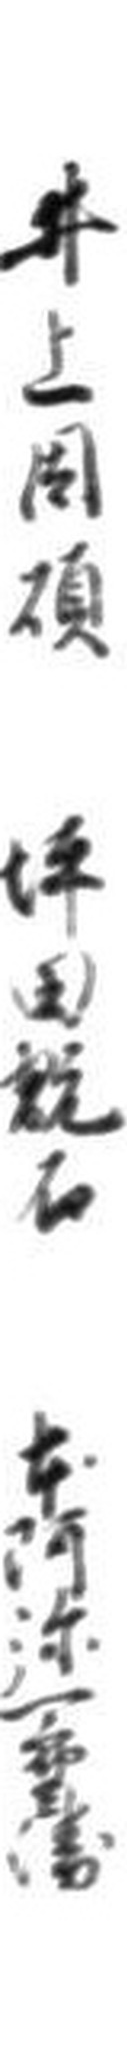井上因碩坪田翫石本阿弥一郎兵衛
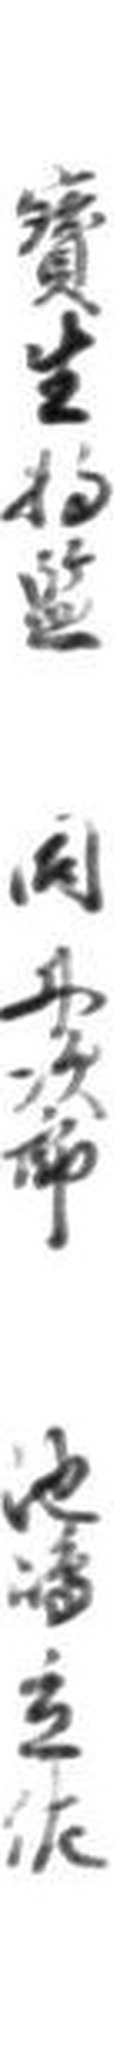宝生将監同丹次郎池嶋立佐
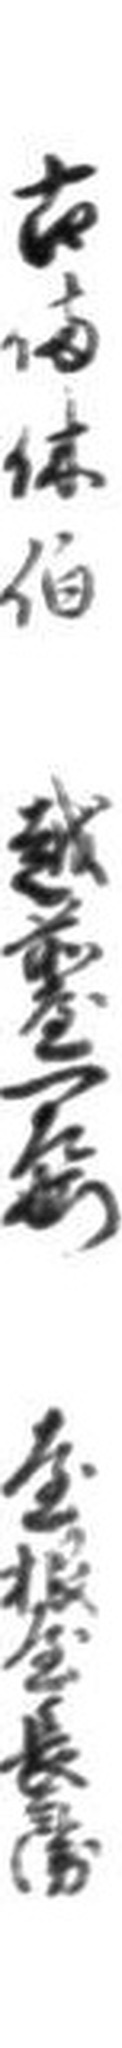古満休伯越前屋一左衛門屋根屋長兵衛
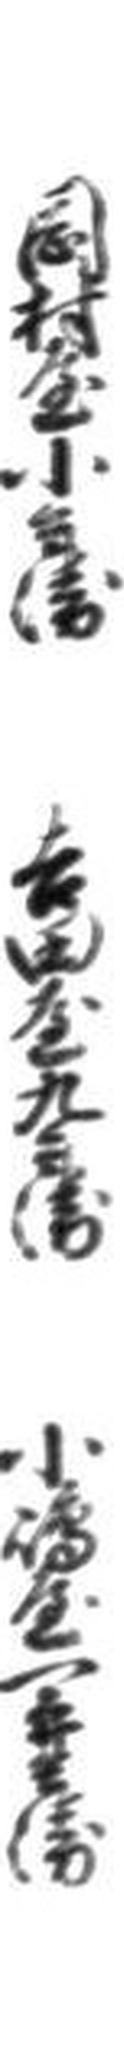岡村屋小兵衛吉田屋九兵衛小幡屋一郎兵衛
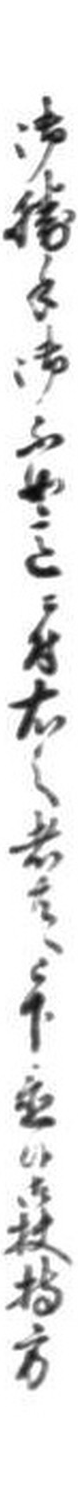御勝手御不如意ニ付右之者共へ被下置候御扶持方

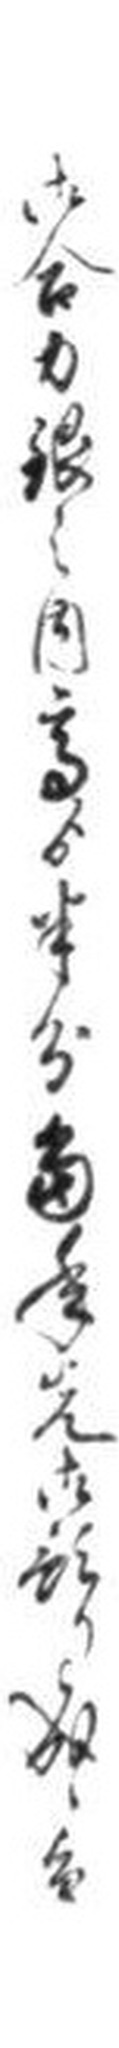御合力銀之内高ゟ半分当年先御預り被成候旨
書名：家譜 三十六 宗昌公 従享保八年到同九年
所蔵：福井県文書館 Fukui Prefectural Archives
